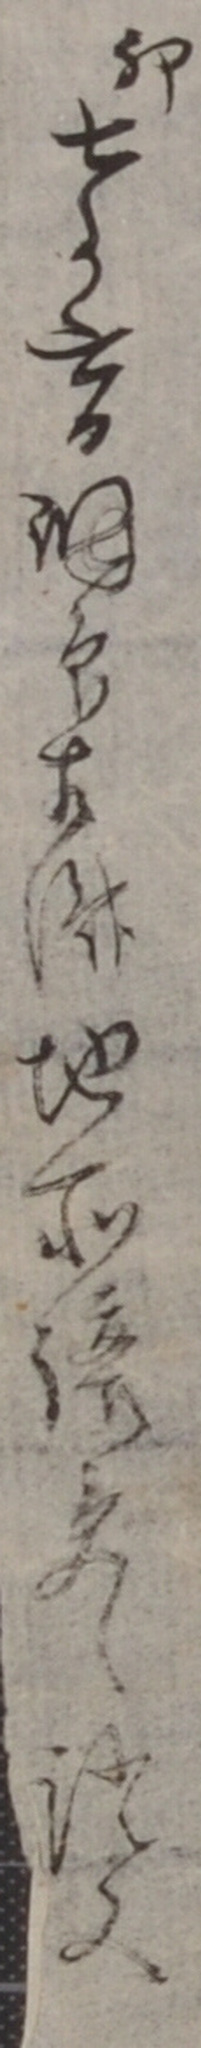卯七月六日調印相済地所譲り受候証文

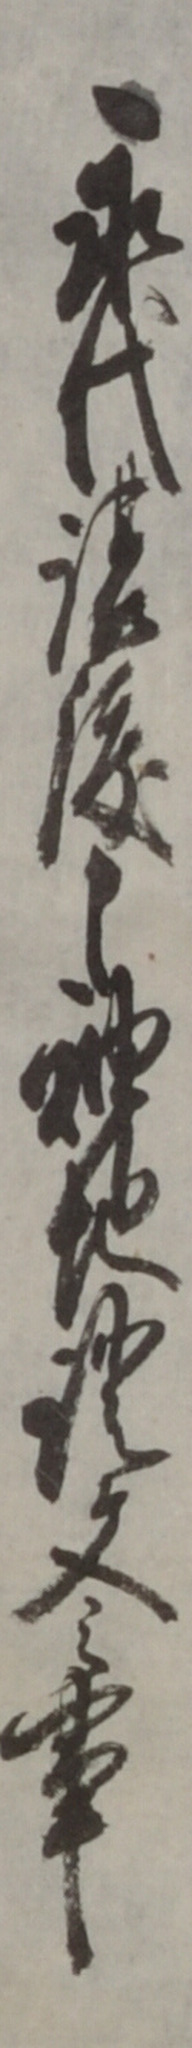永代譲渡申神地証文之事
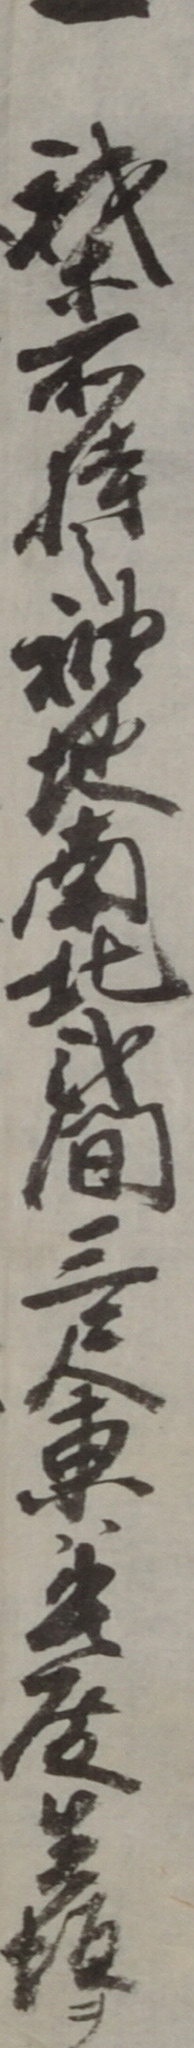一我等所持之神地南北弐間三尺東ハ貴殿生垣ヲ
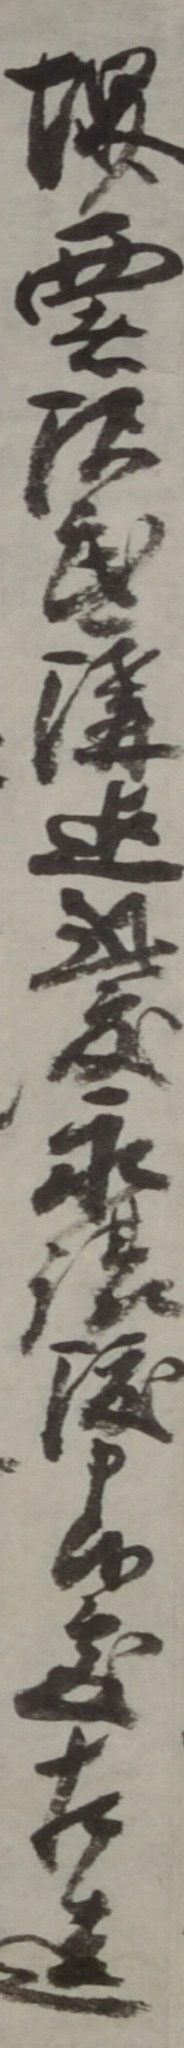境西者沢底溝迄此度永譲渡申候処相違
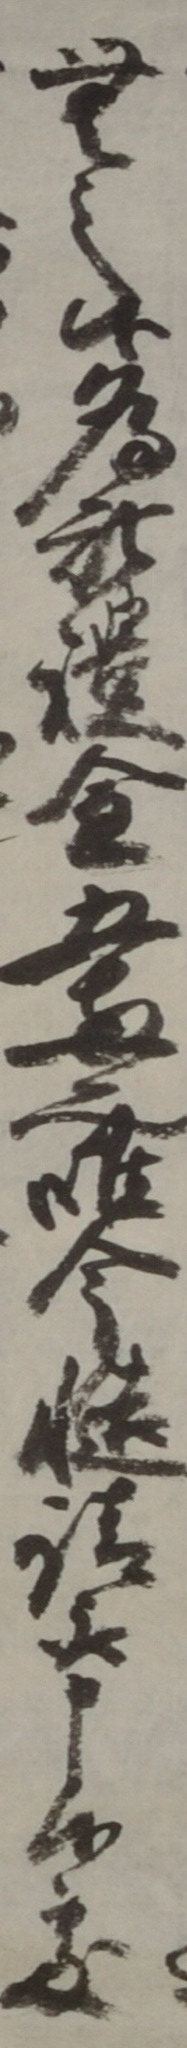無之候為此礼金五両也唯今慥請取申候処
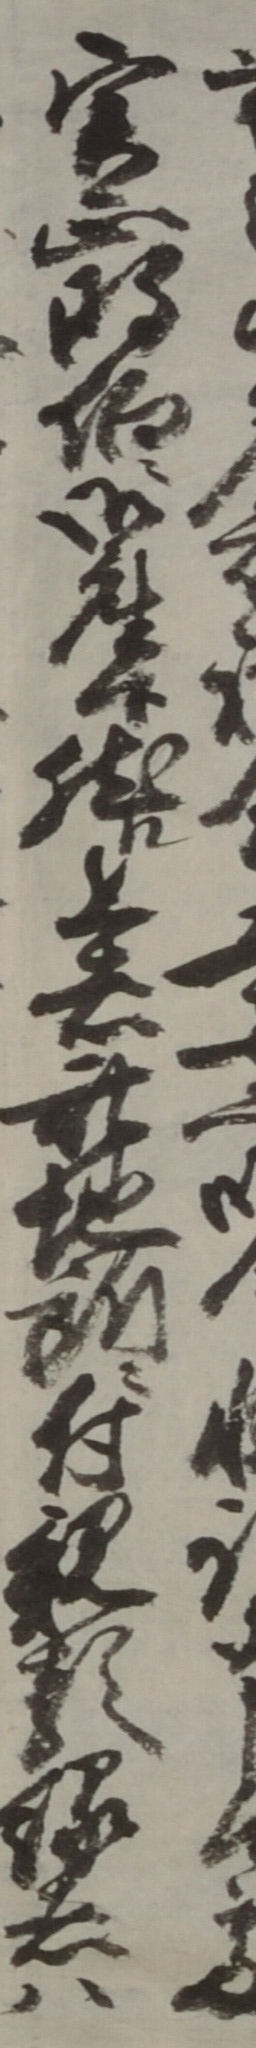実正明伯ニ御座候然ル上者此地所ニ付親類縁者ハ
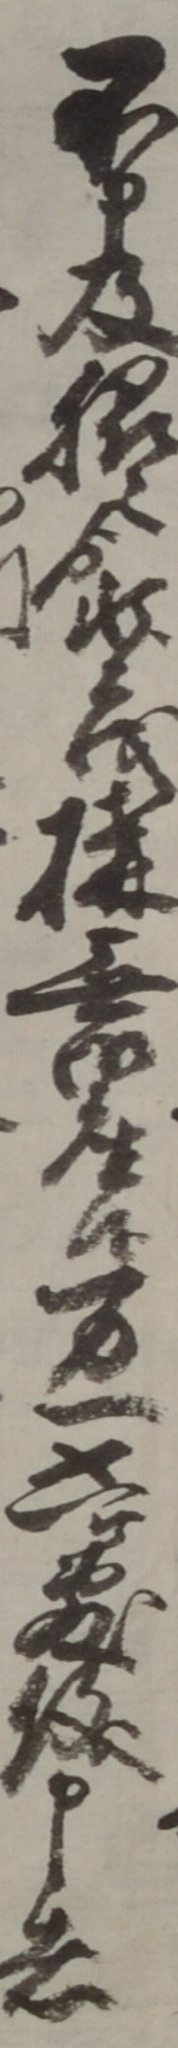不申及脇々ゟ少茂構無御座候万一六ケ敷儀申者
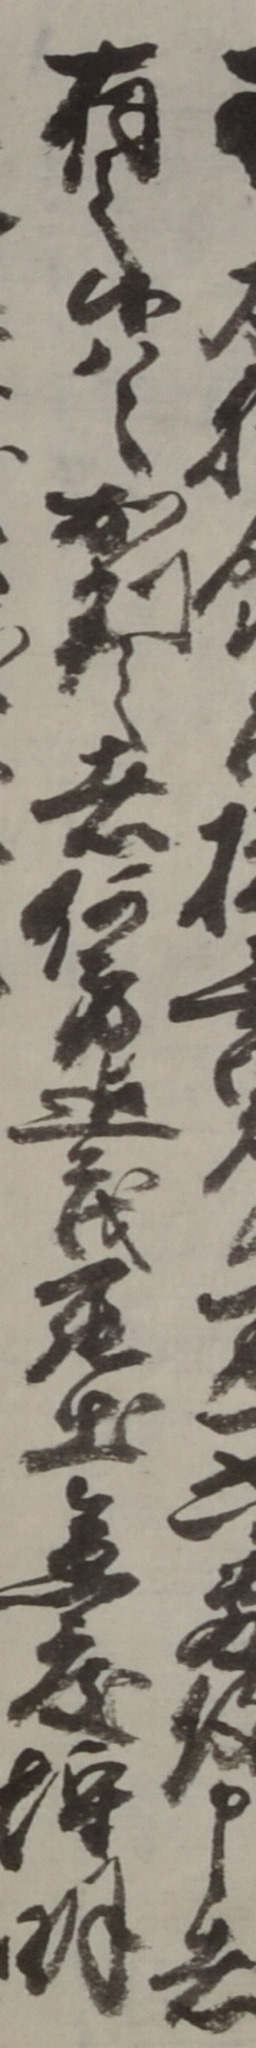有之候ハゝ加判之者何方迠茂罷出急度埒明
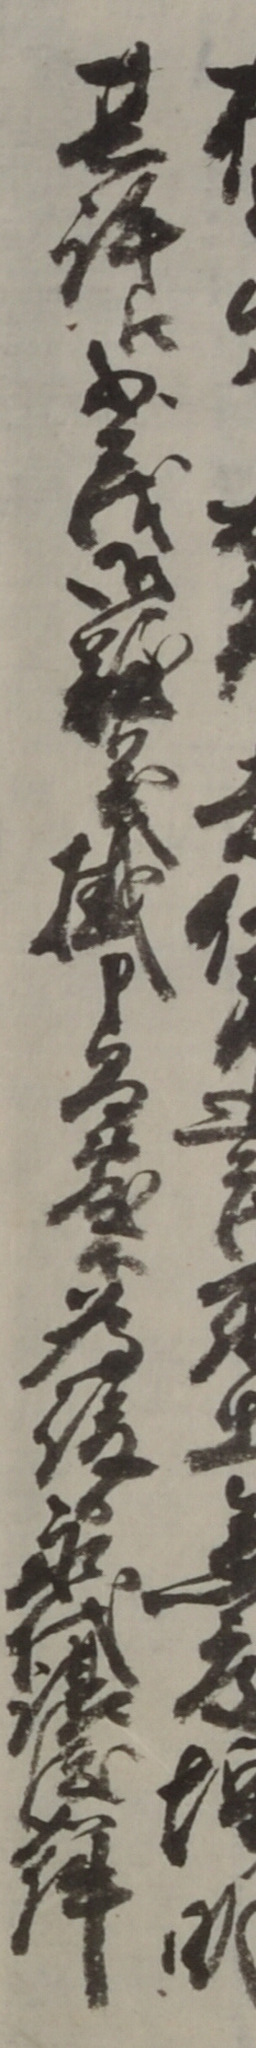其許江少茂御難義掛申間敷候為後日永代譲渡如件
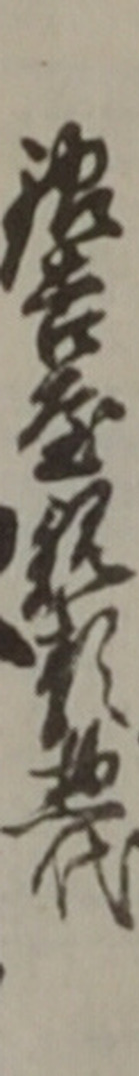銀杏屋親類惣代
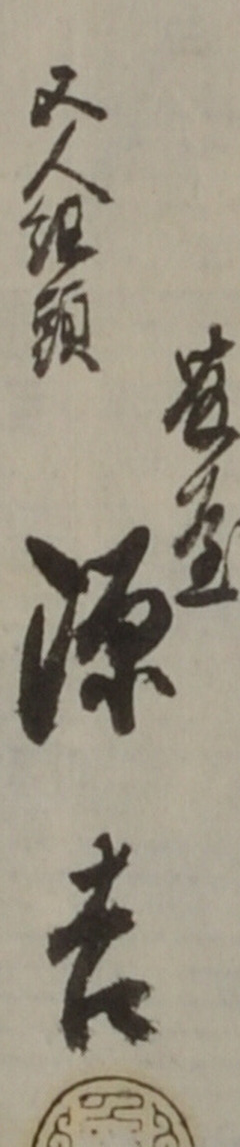五人組頭源吉㊞
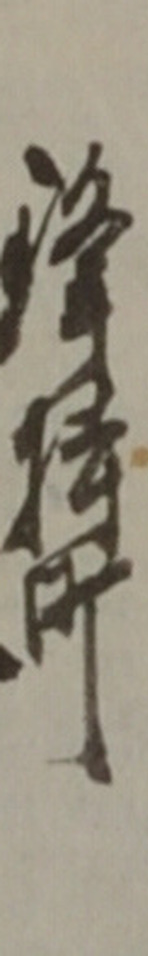鉾持町
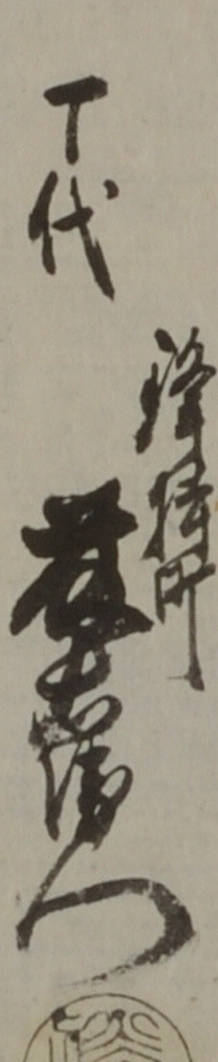丁代藤右衛門㊞
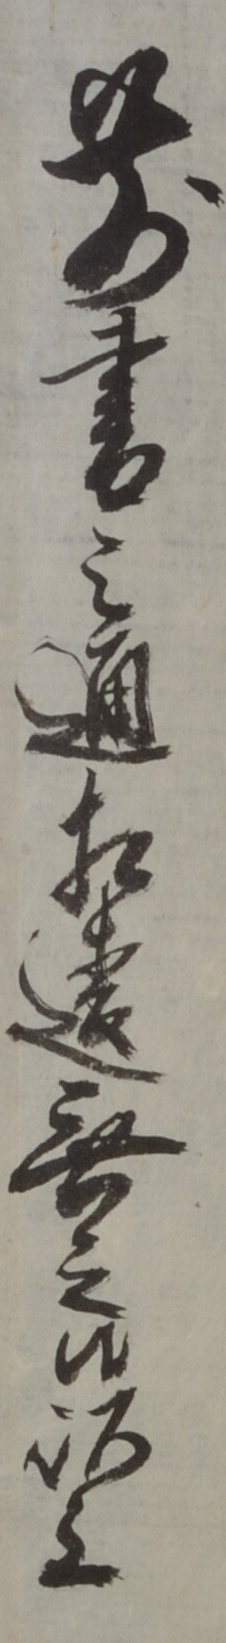前書之通相違無之候以上
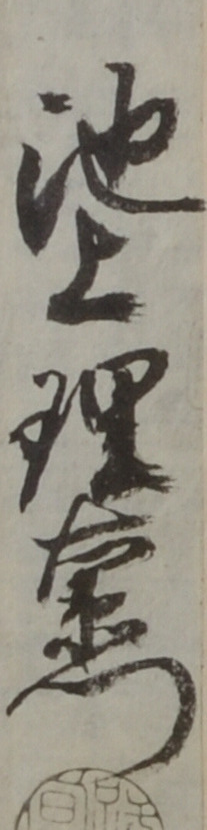池上理右衛門㊞
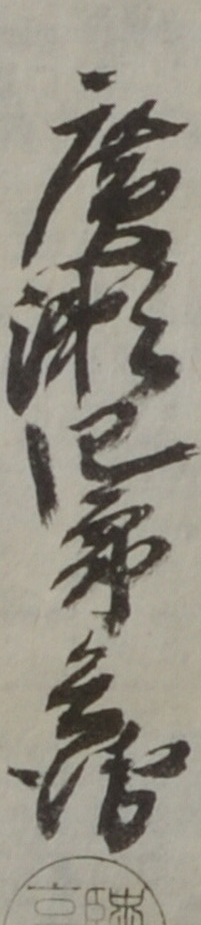広瀬四郎兵衛㊞
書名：永代譲渡申神地証文之事
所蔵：伊那市立高遠町図書館・合同会社AMANE
